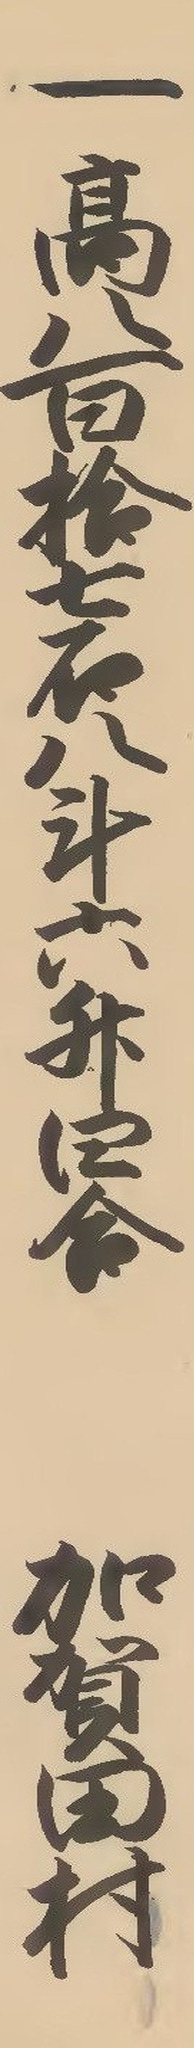一高八百拾七石八斗六升四合加賀田村
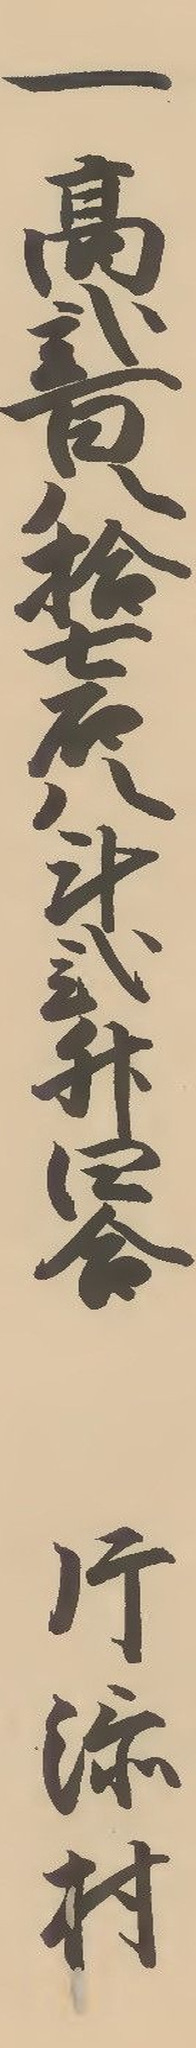一高弐百八拾七石八斗弐升四合片添村
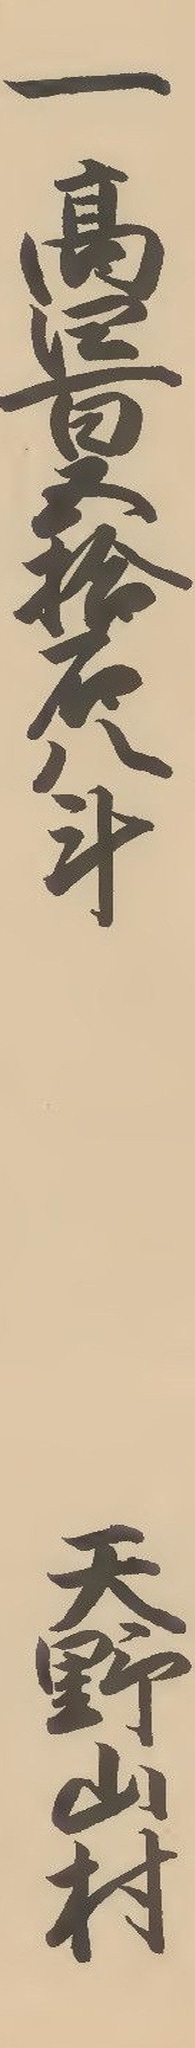一高四百五拾石八斗天野山村
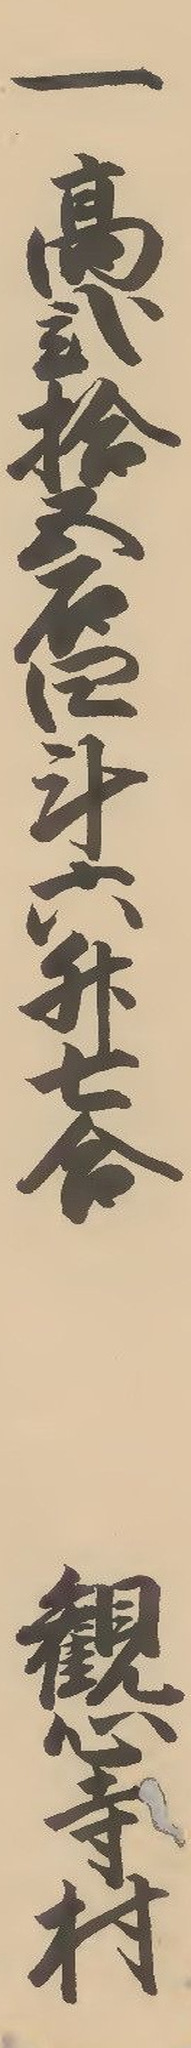一高弐拾五石四斗六升七合観心寺村

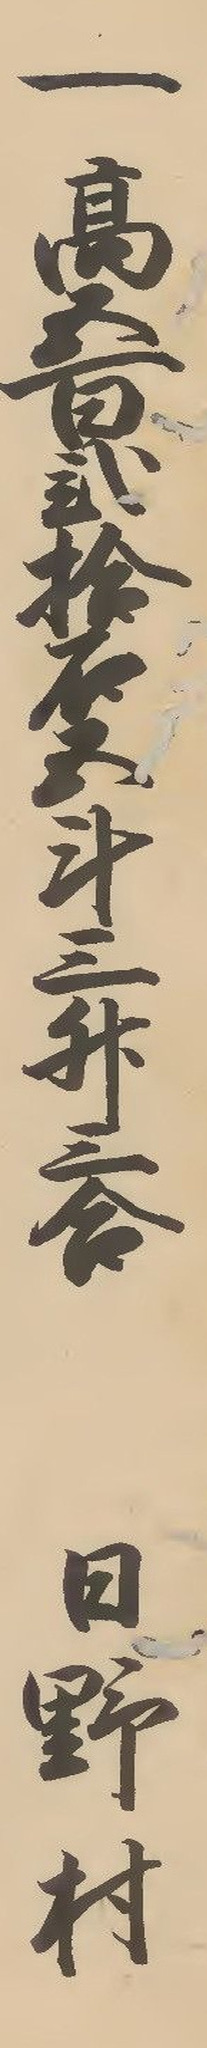一高五百弐拾石五斗三升三合日野村
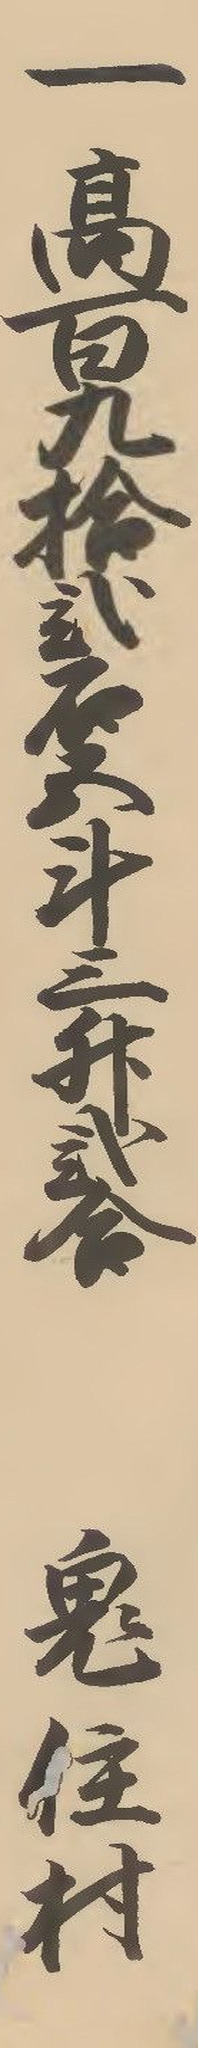一高百九拾弐石五斗三升弐合鬼住村
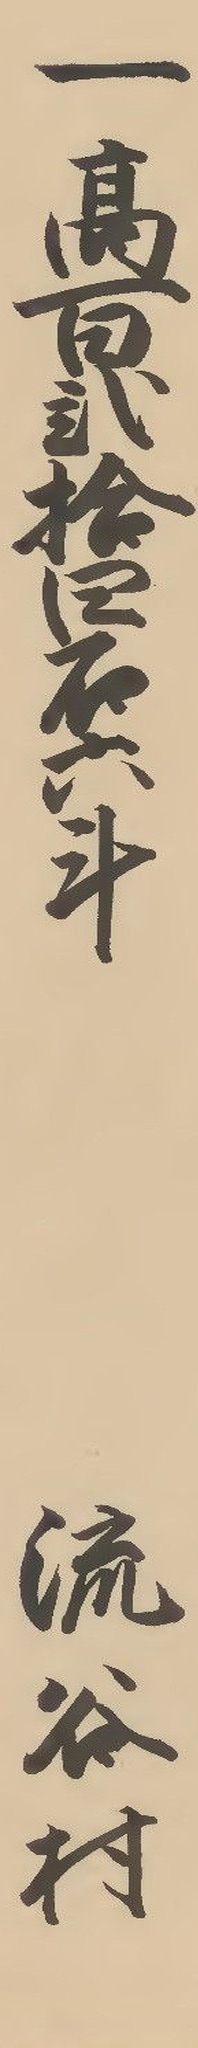一高百弐拾四石六斗流谷村
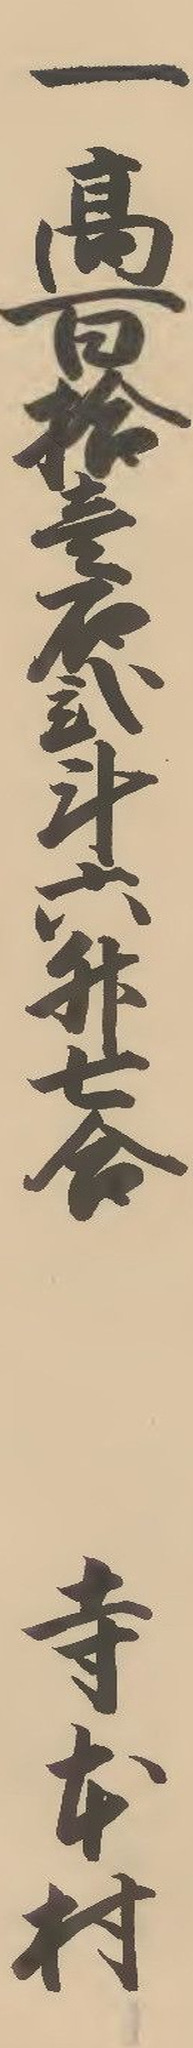一高百拾壱石弐斗六升七合寺本村
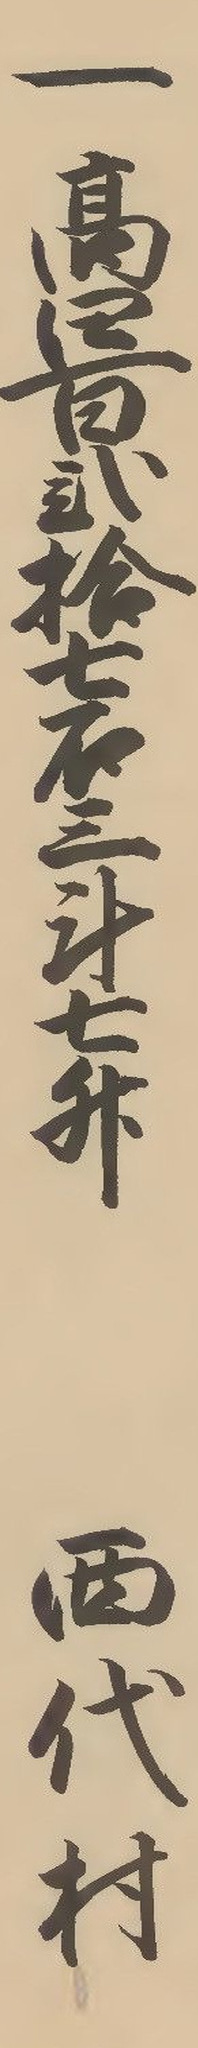一高四百弐拾七石三斗七升西代村
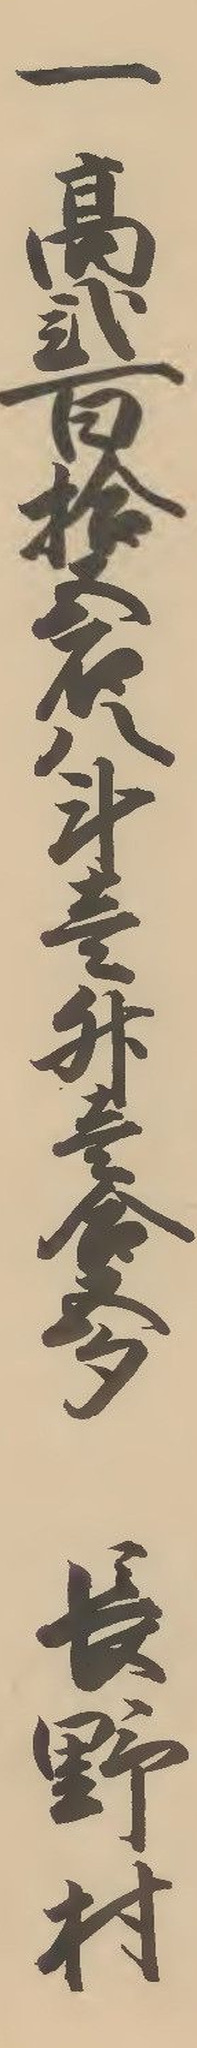一高弐百拾五石八斗壱升壱合五勺長野村
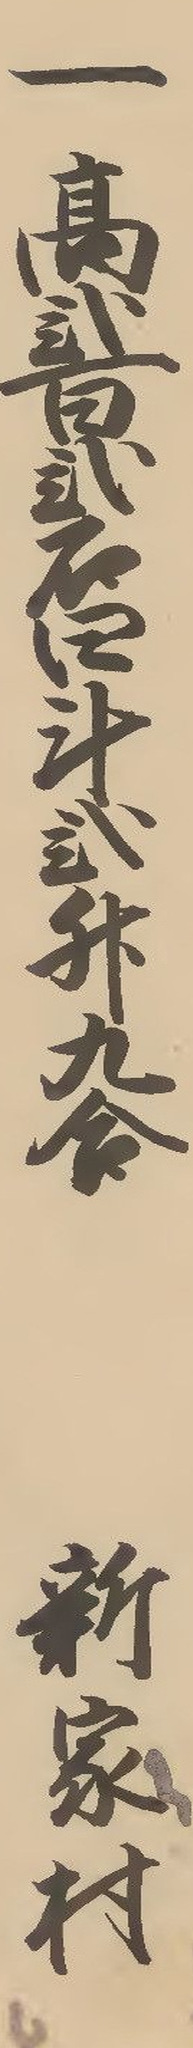一高弐百弐石四斗弐升九合新家村
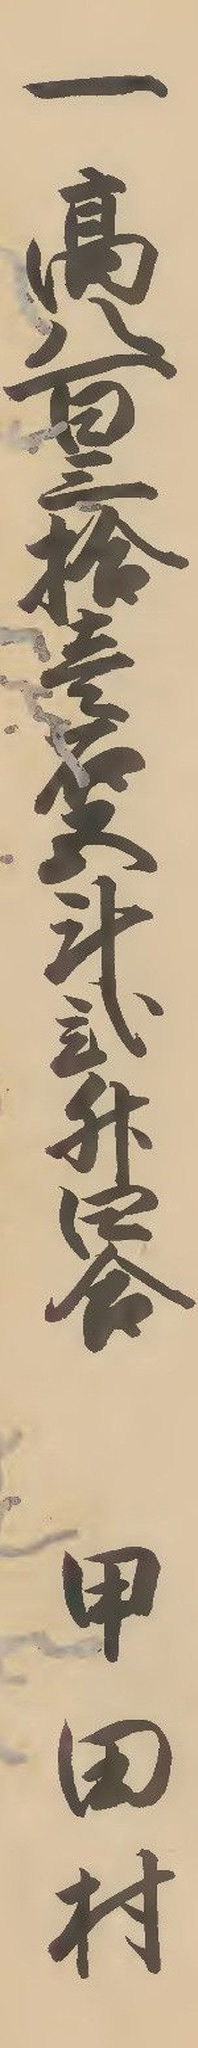一高八百三拾壱石五斗弐升四合甲田村

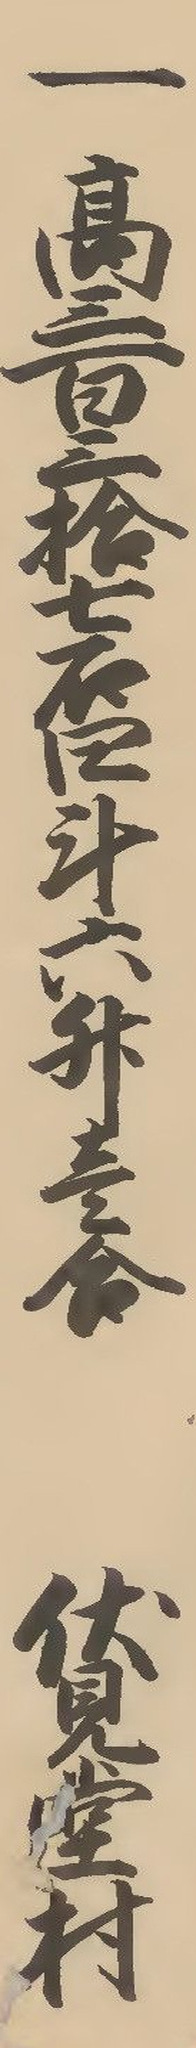一高三百三拾七石四斗六升壱合伏見堂村
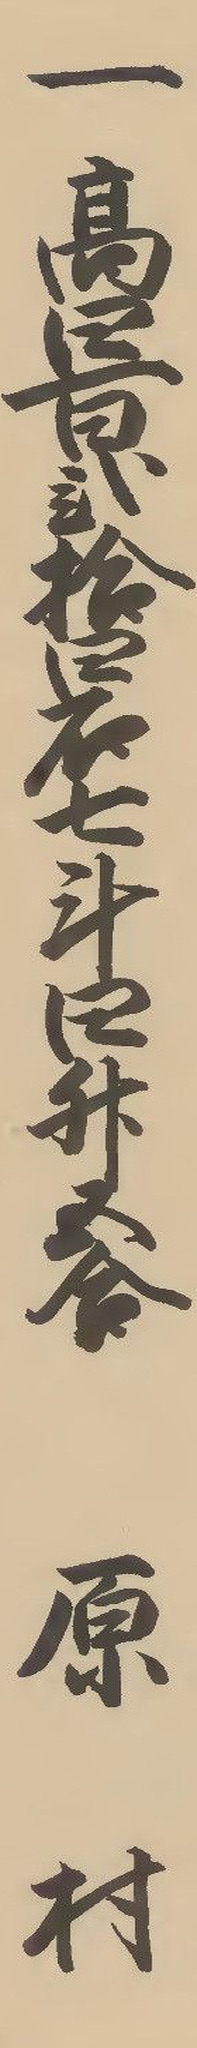一高四百弐拾四石七斗四升五合原村
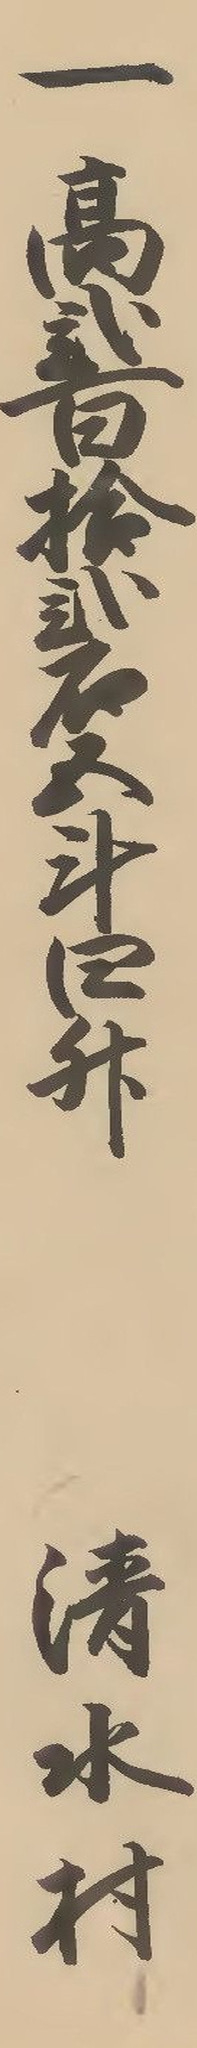一高弐百拾弐石五斗四升清水村
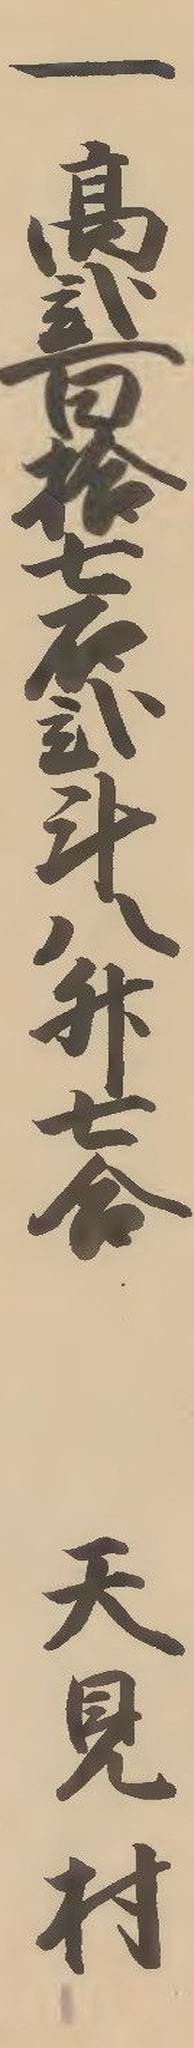一高弐百拾七石弐斗八升七合天見村
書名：河内国郷帳
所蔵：国立公文書館 National Archives of Japan
